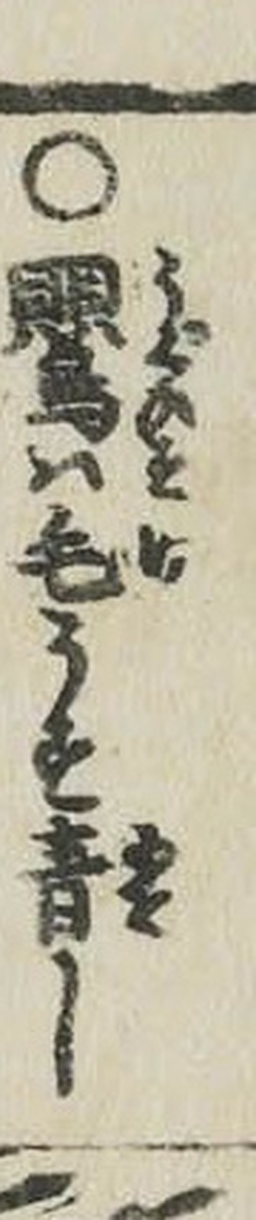○鸎は毛うす青し
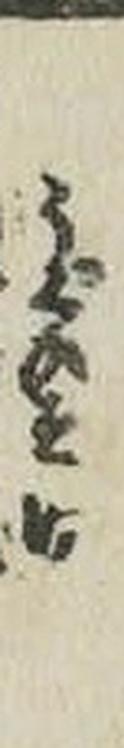うぐひす
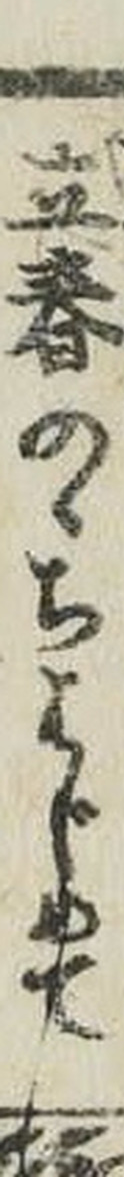立春のゝちはじめて
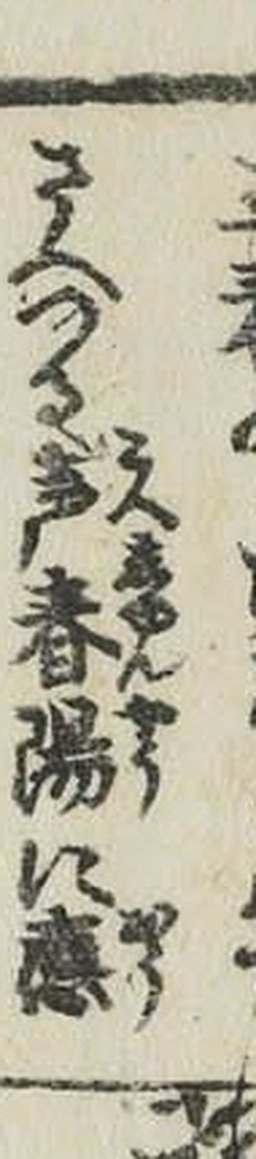さへつる声春陽に応
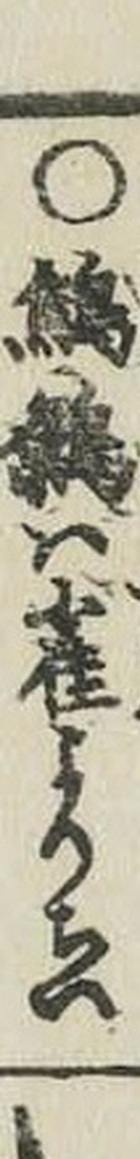○鷦鷯は雀よりちい
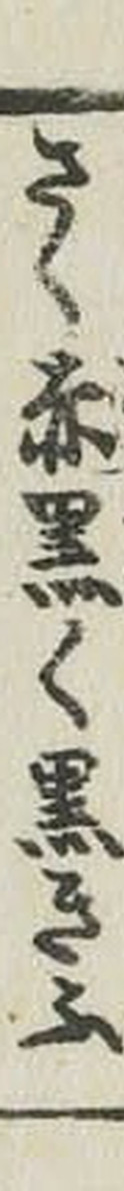さく赤黒く黒きふ
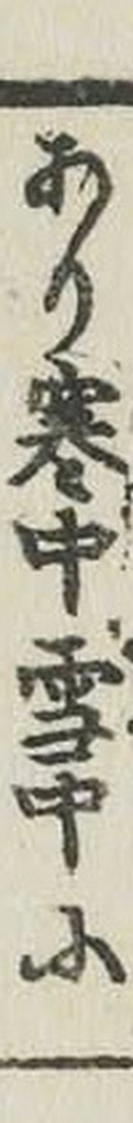あり寒中雪中に
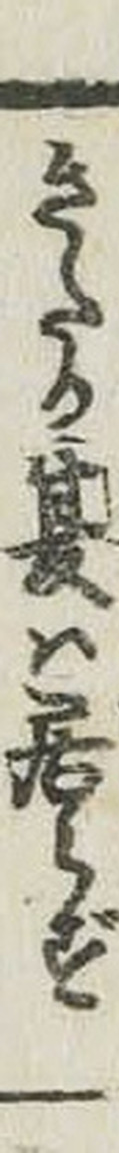きたる夏は居らず
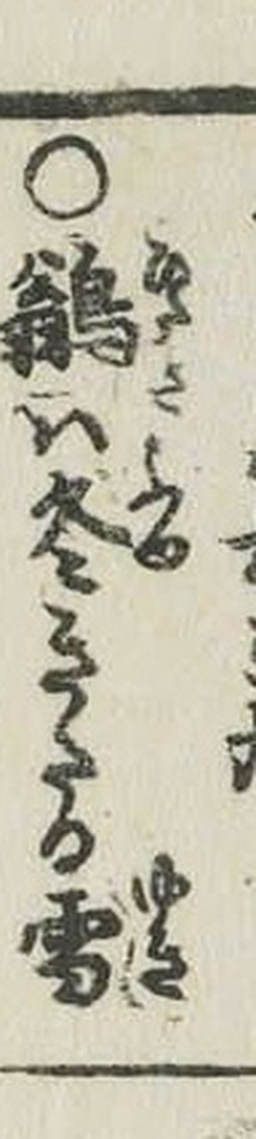○鶲は冬きたる雪
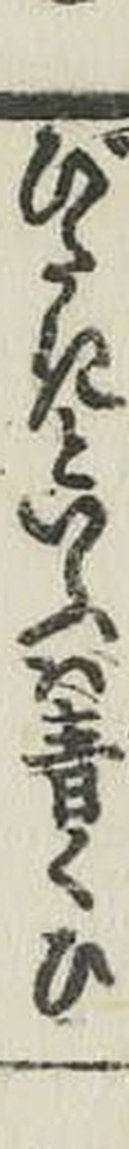びたきといふは青くひ
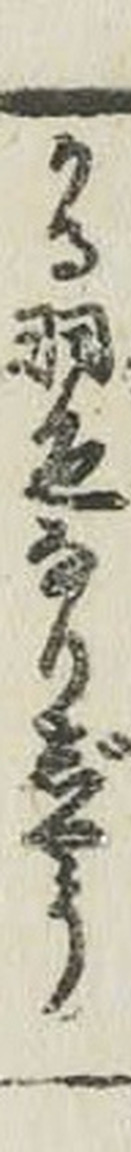かる羽色なりじやう
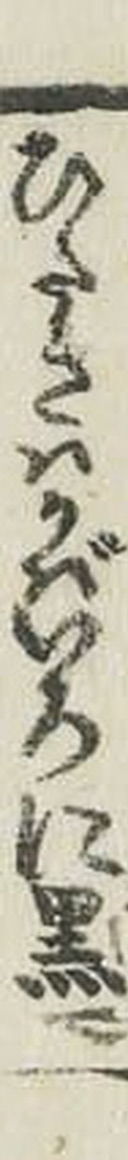ひたきはかばいろに黒
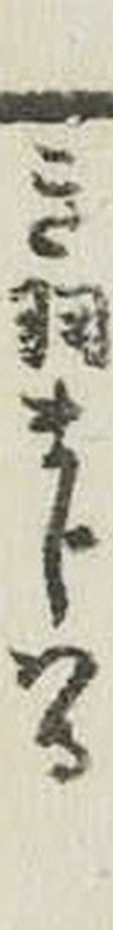き羽まじる
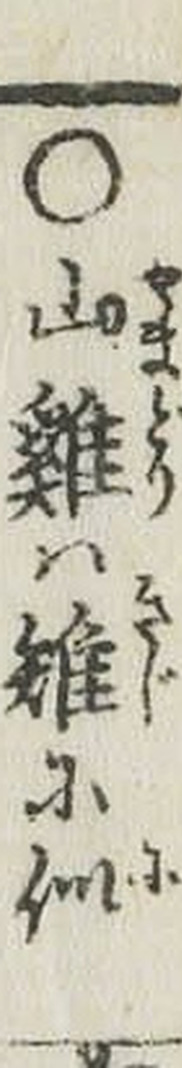○山鶏は雉に似
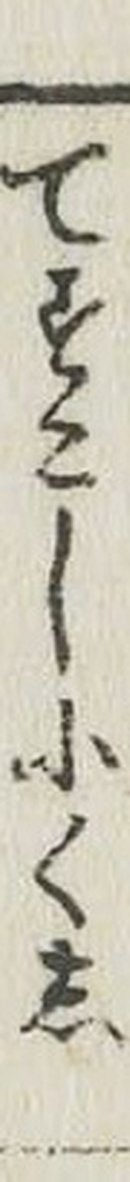てすこし小くし
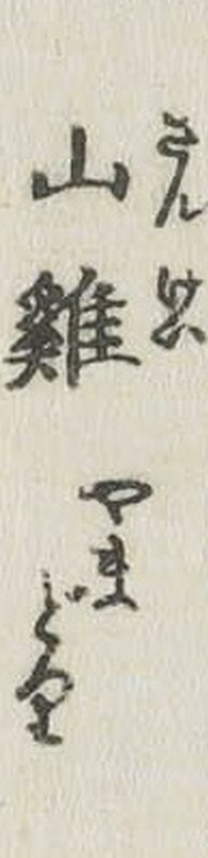山鶏やまどり
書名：増補頭書訓蒙図彙大成 10巻 6:巻之12-13
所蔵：東京学芸大学教育コンテンツアーカイブ
